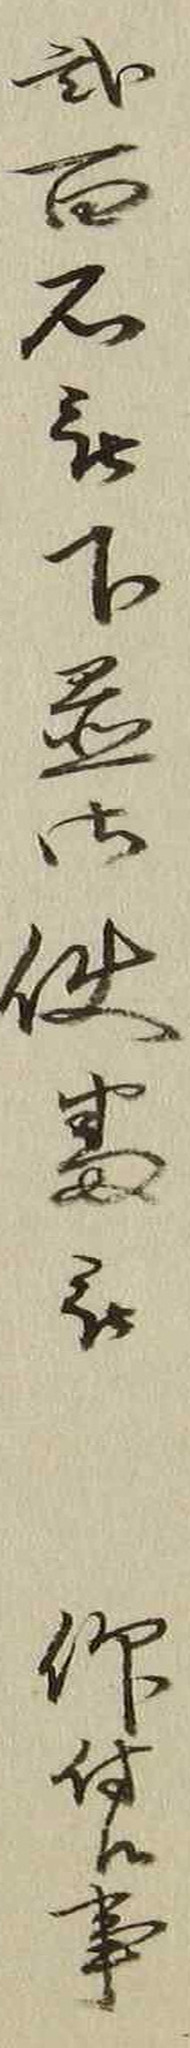弐百石被下置御使番被仰付候事
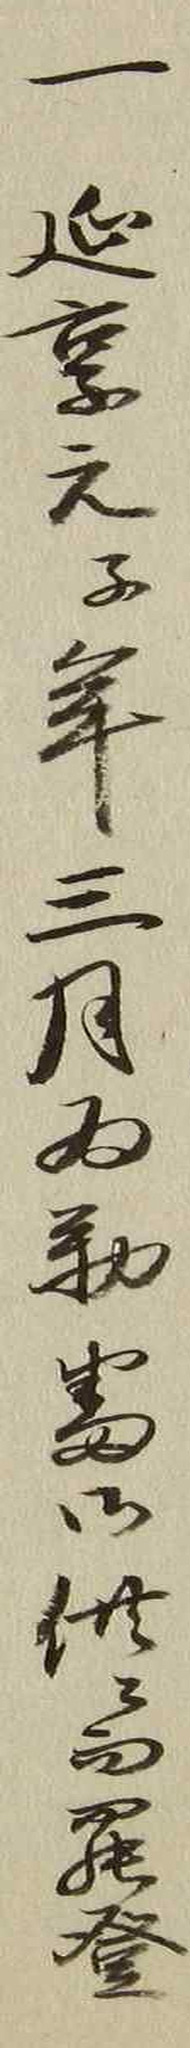一延享元子年三月為勤番御供に而罷登
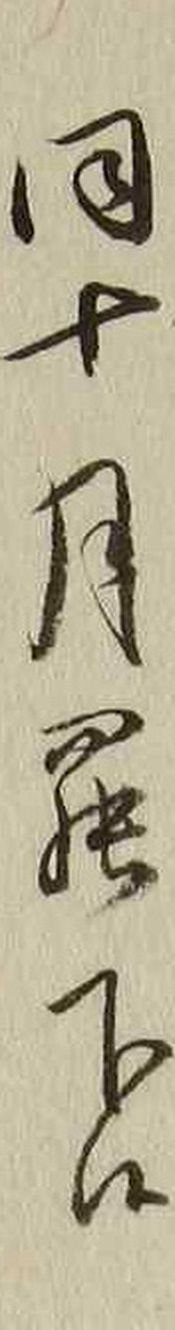同十月罷下候
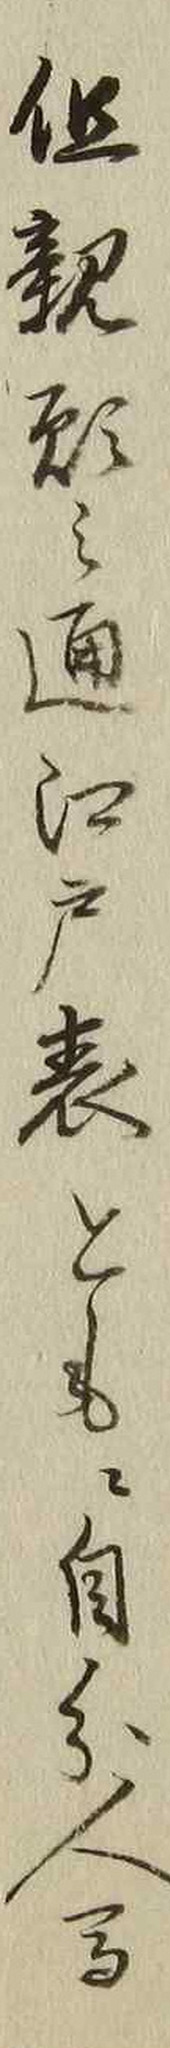但親願之通江戸表ともに自分人馬
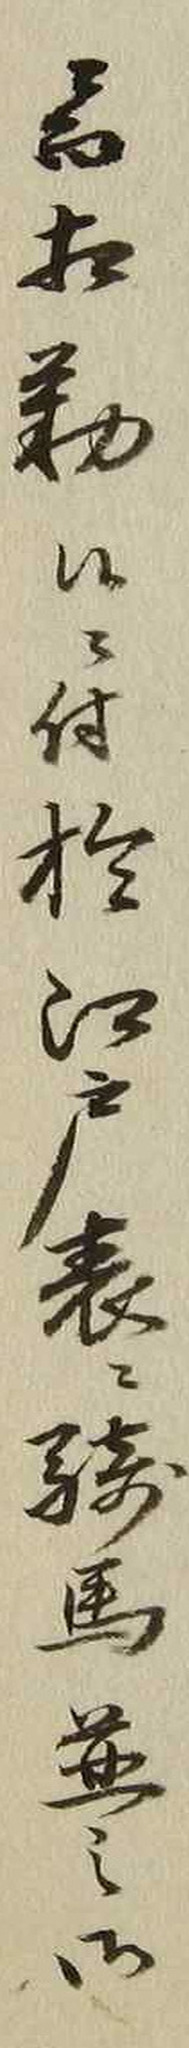に而相勤候に付於江戸表に騎馬並之御
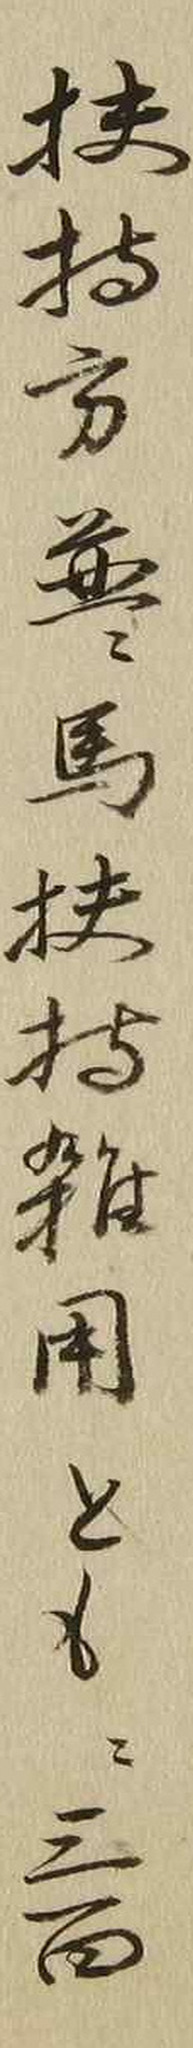扶持方並に馬扶持雑用ともに三百
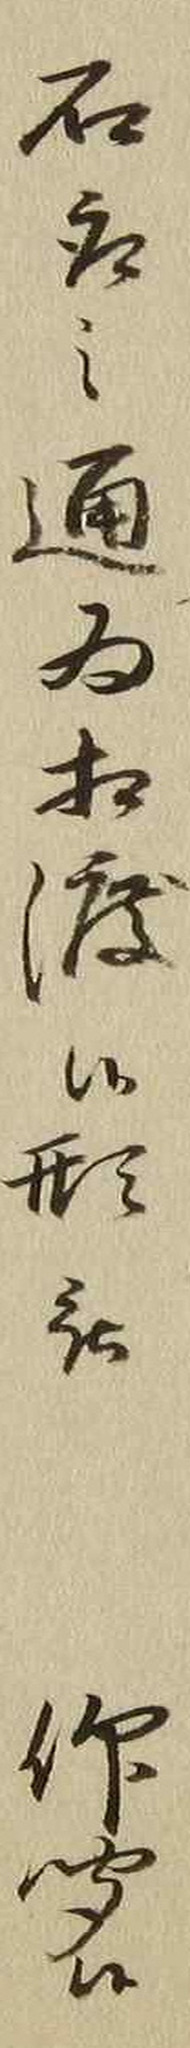石取之通為相渡候形被仰聞候
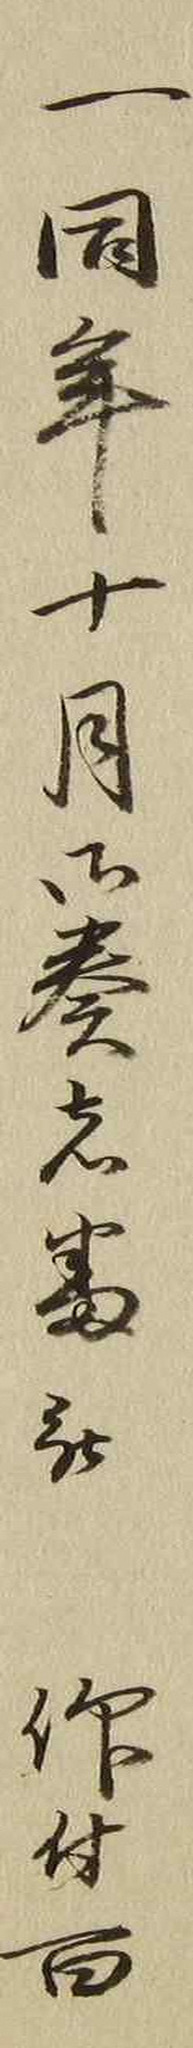一同年十月御奏者番被仰付百
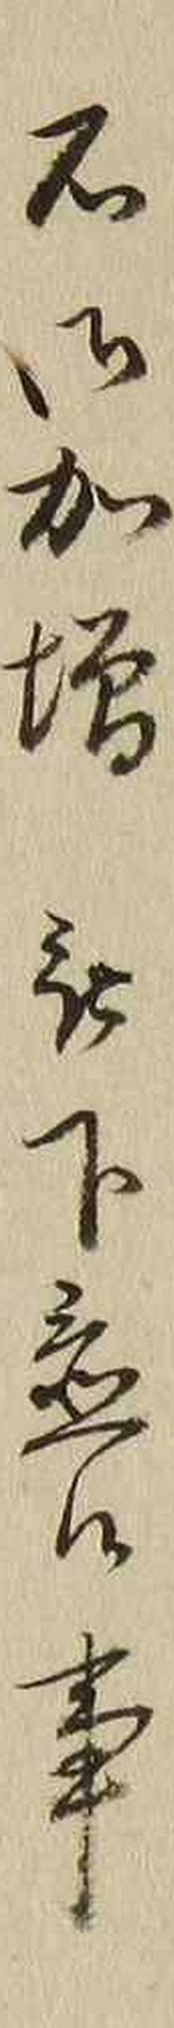石御加増被下置候事
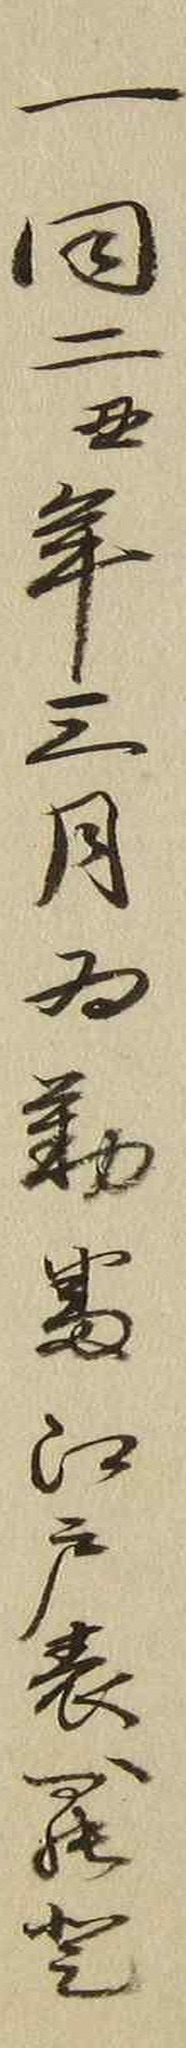一同二丑年三月為勤番江戸表へ罷登
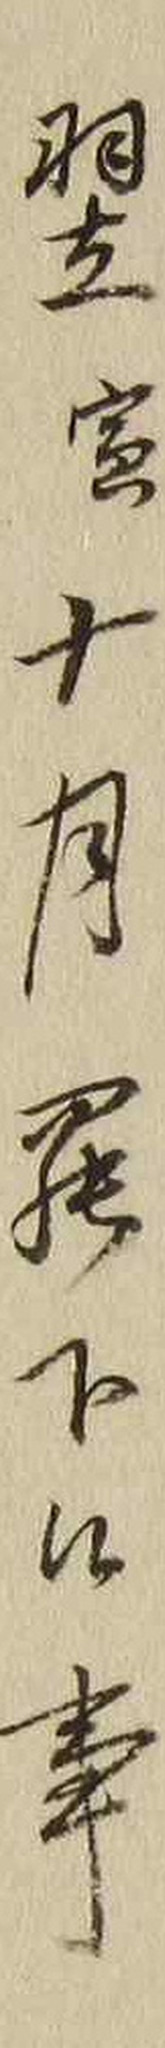翌寅十月罷下候事
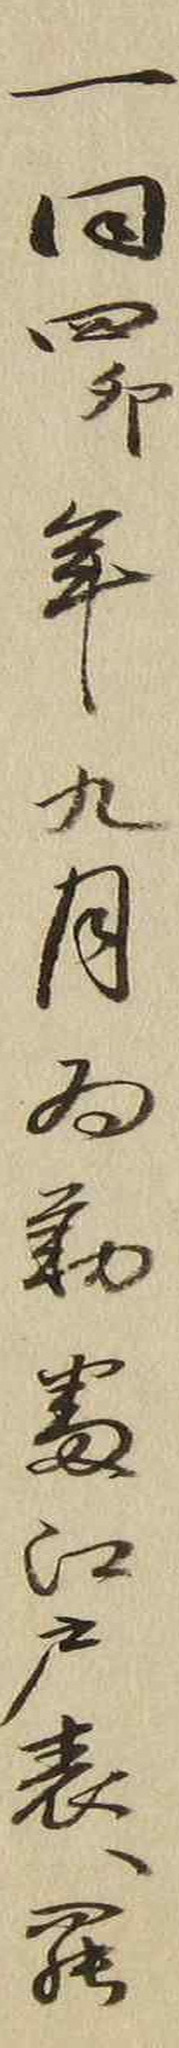一同四卯年九月為勤番江戸表へ罷
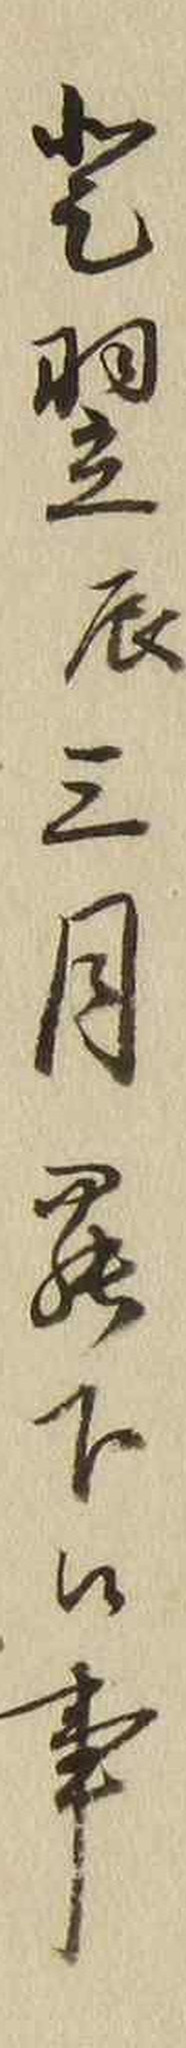登翌辰三月罷下候事
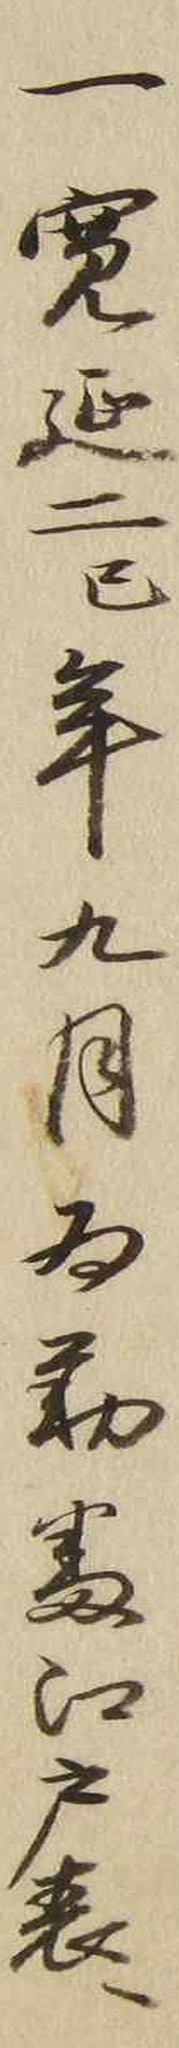一寛延二巳年九月為勤番江戸表へ

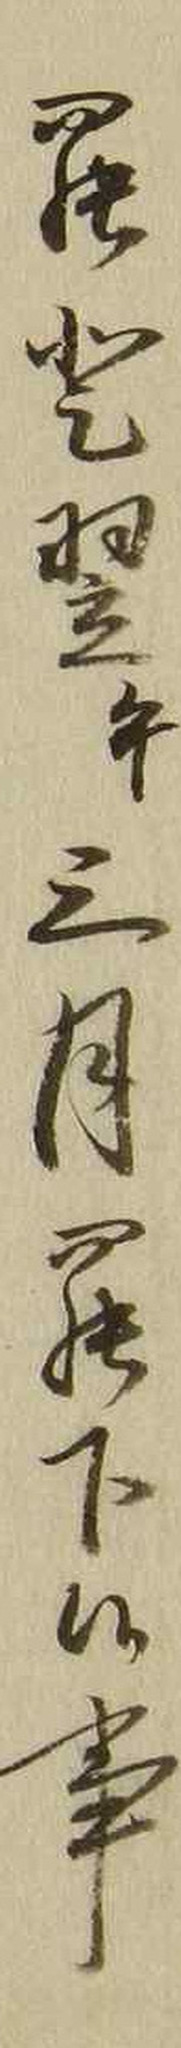罷登翌午三月罷下候事
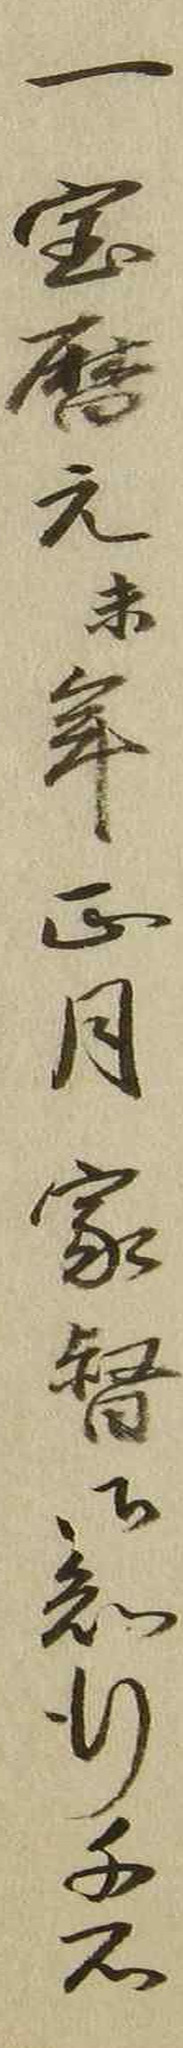一宝暦元未年正月家督御知行千石
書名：諸士系譜　巻之133　た之部9
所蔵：会津若松市立会津図書館
